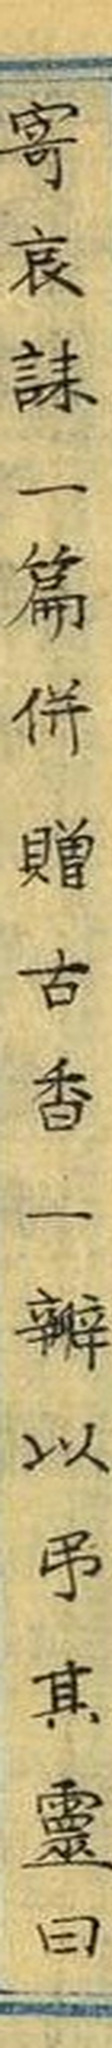寄哀誄一篇併贈古香一瓣以弔其靈曰
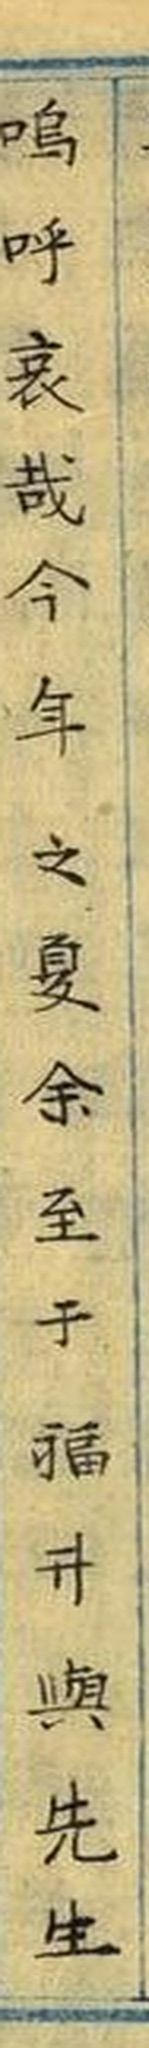嗚呼哀哉今年之夏余至于福井與先生
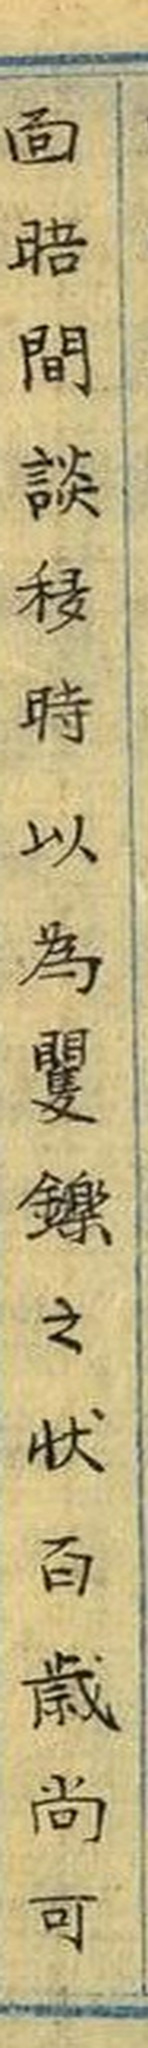靣晤間談移時以為矍鑠之状百歳尚可
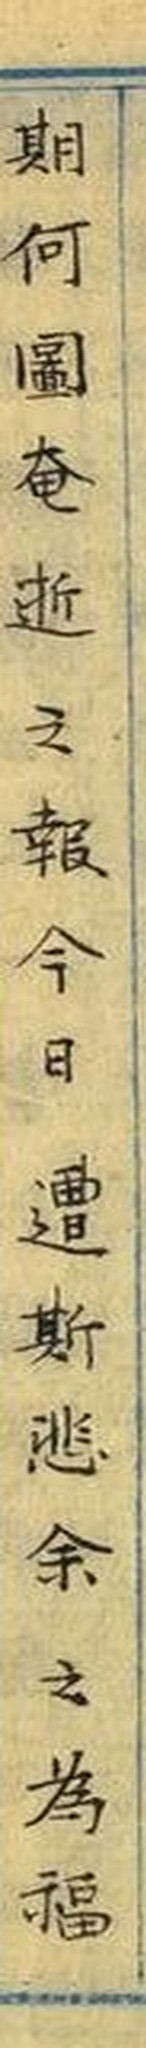期何圖奄逝之報今日遭斯悲余之為福
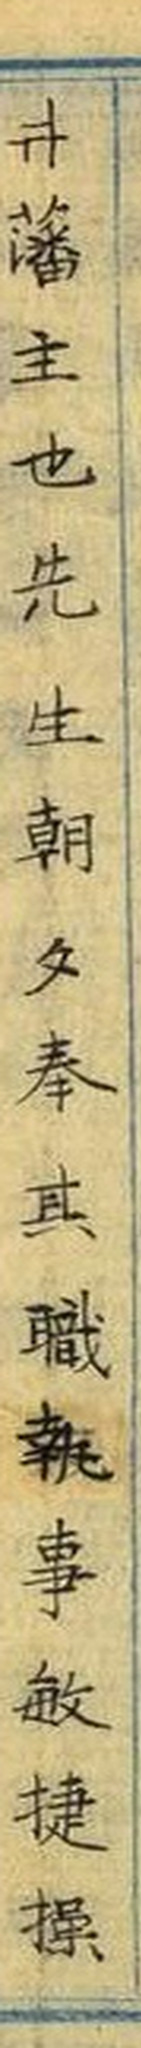井藩主也先生朝夕奉其職執事敏捷操
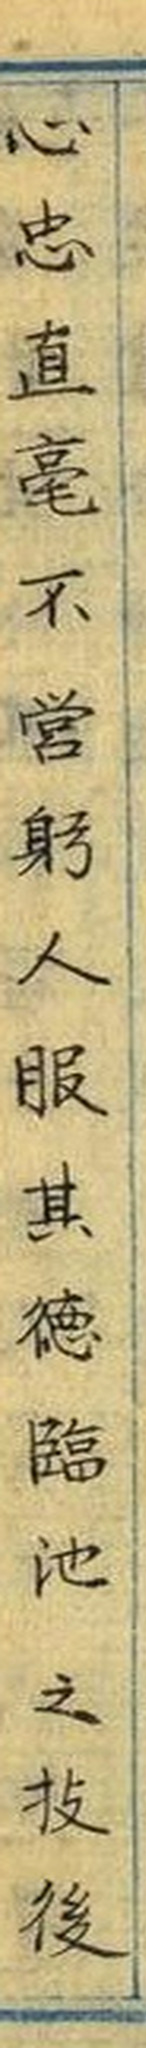心忠直毫不営躬人服其徳臨池之技後

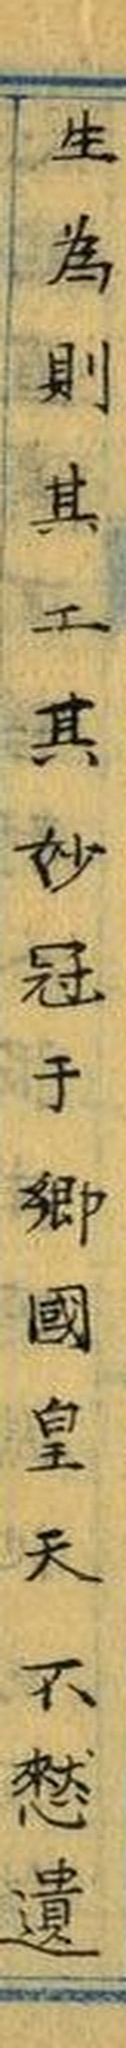生為則其工其妙冠于郷國皇天不憖遺
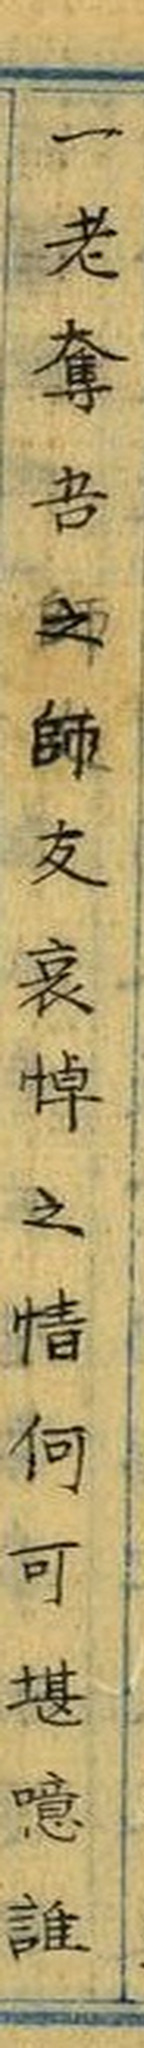一老奪吾之師友哀悼之情何可堪噫誰
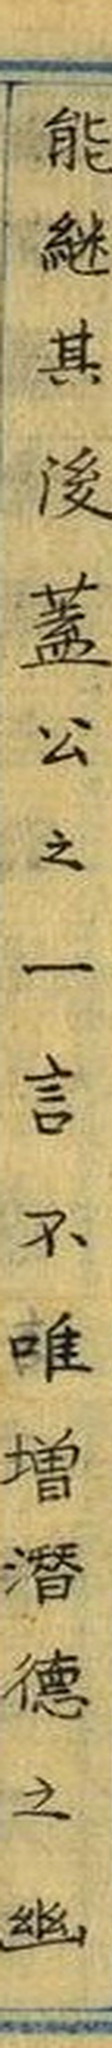能継其後蓋公之一言不唯増潜德之幽
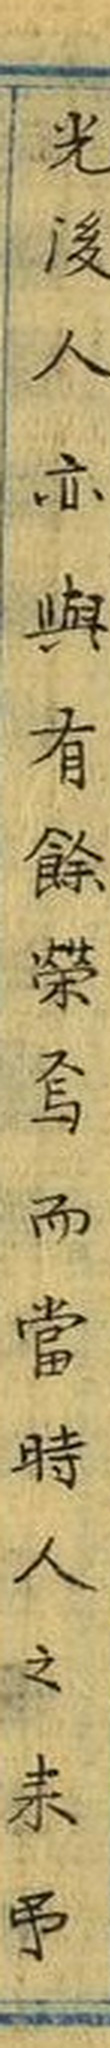光後人亦與有餘榮焉而當時人之来弔
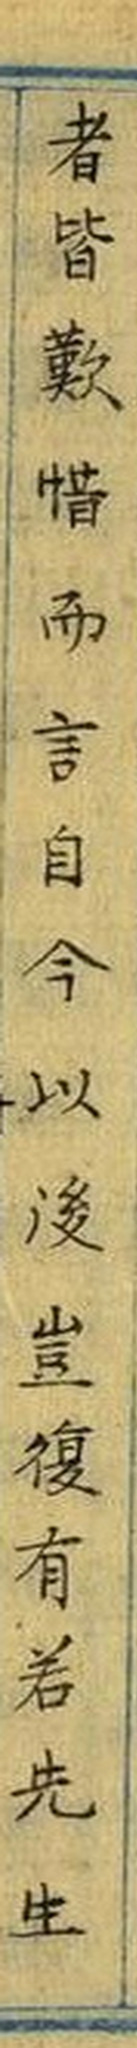者皆歎惜而言自今以後豈復有若先生
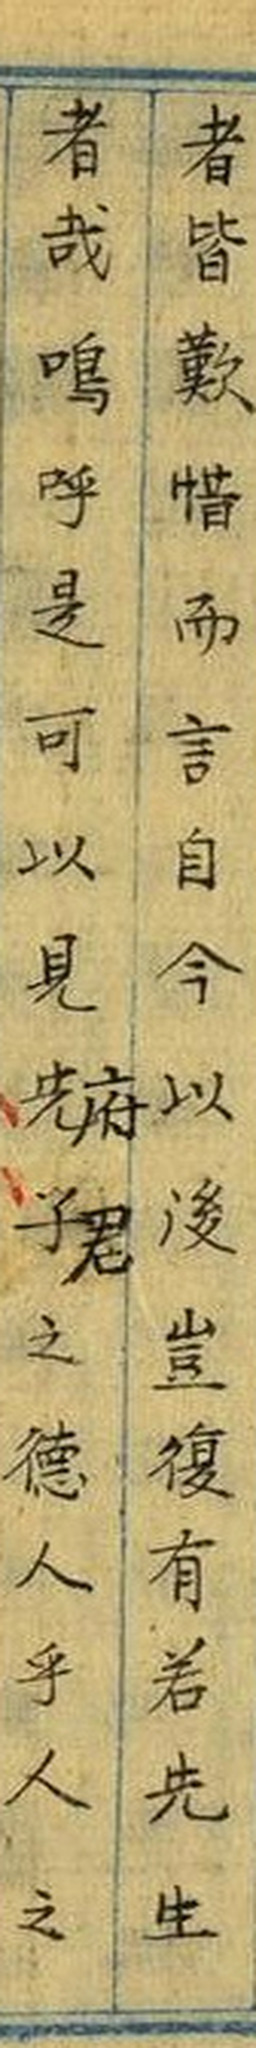者哉嗚呼是可以見府君之德人乎之
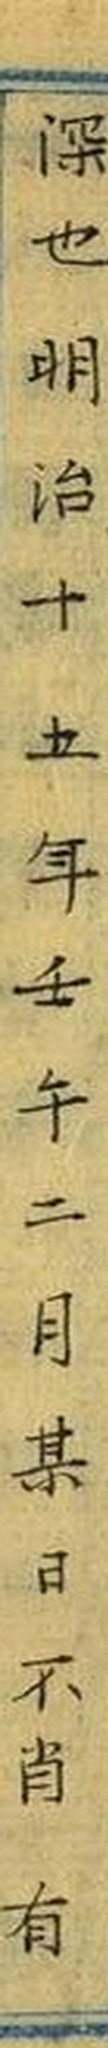深也明治十五年壬午二月某日不肖有
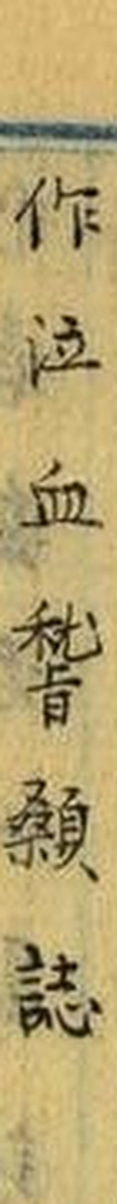作泣血稽顙誌
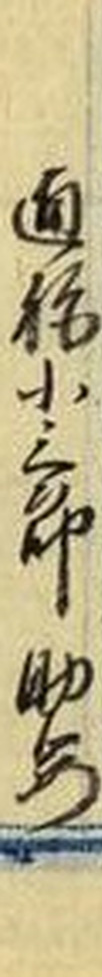通称小三郎助右衛門
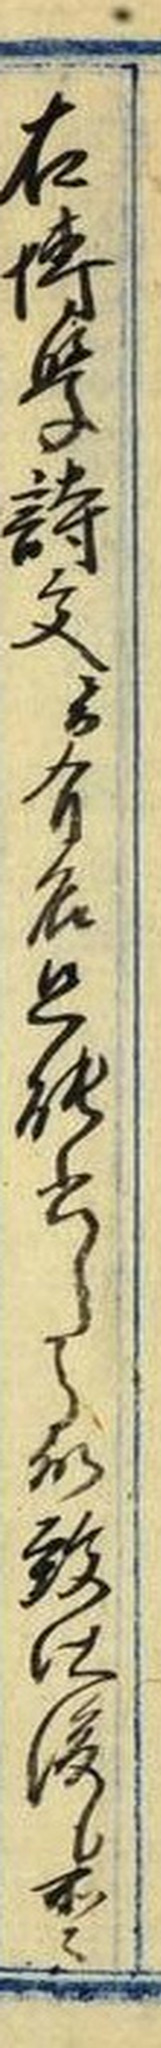右博学詩文に而有名且能書たる故致仕後も所々
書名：温古集 四巻
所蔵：福井県文書館 Fukui Prefectural Archives
